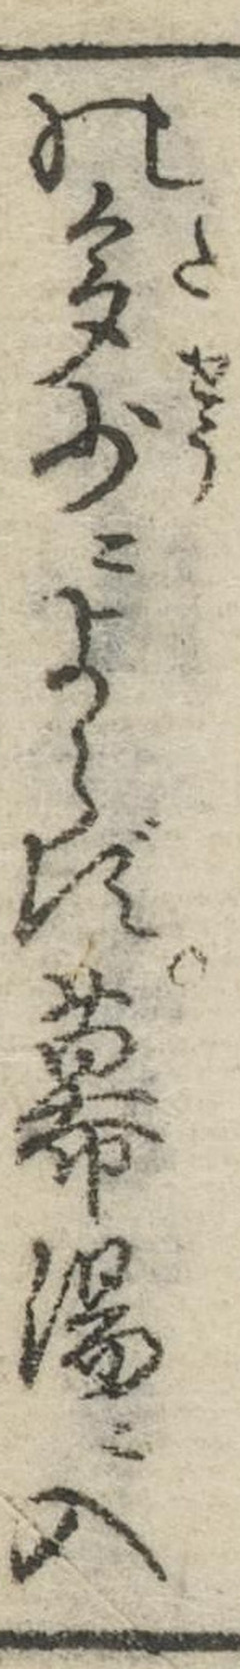の多少によらず。幕湯に入

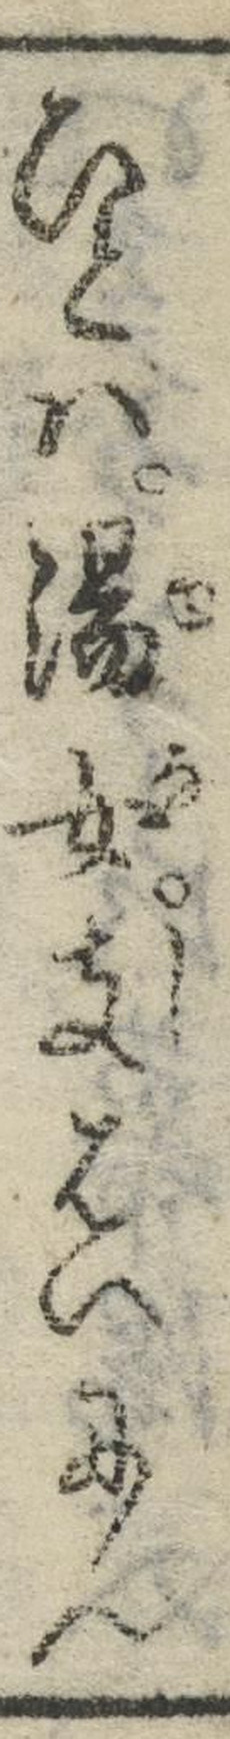ひとは。湯女支はいにん
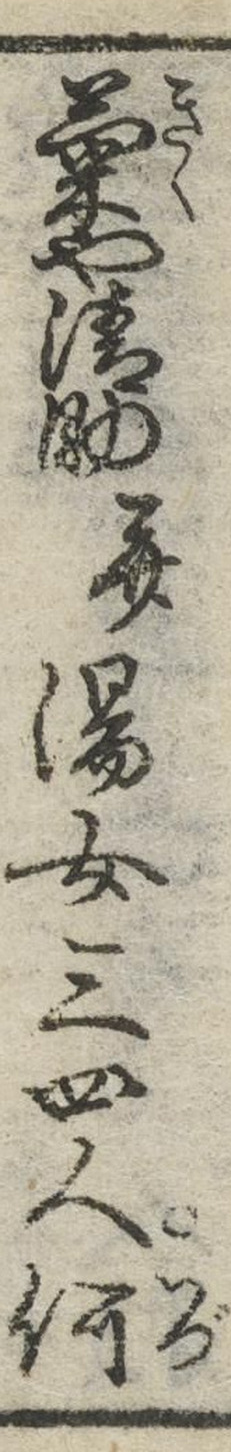菊や清助並湯女三四人。何
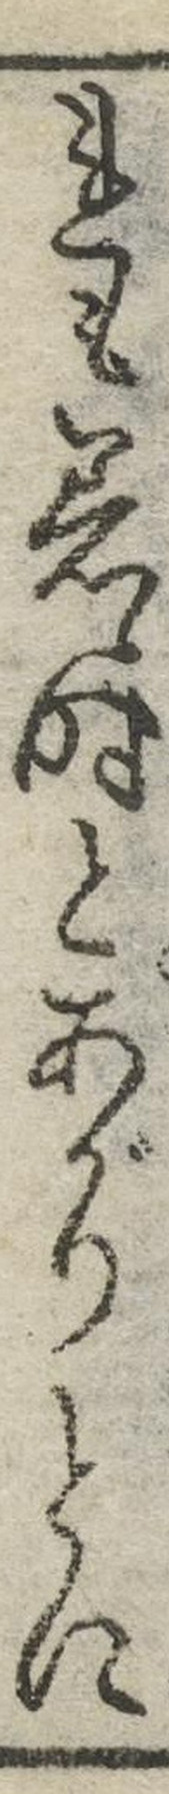れも着時と。あがりとき。
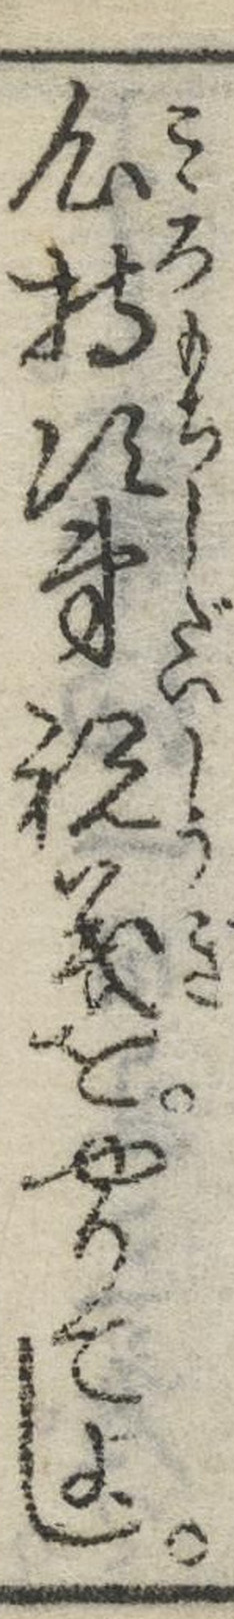心持次第祝義を。やりてよし。
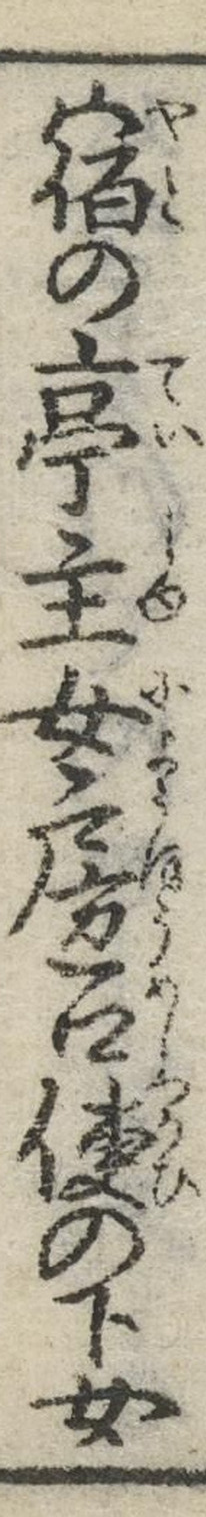宿の亭主女房召使の下女
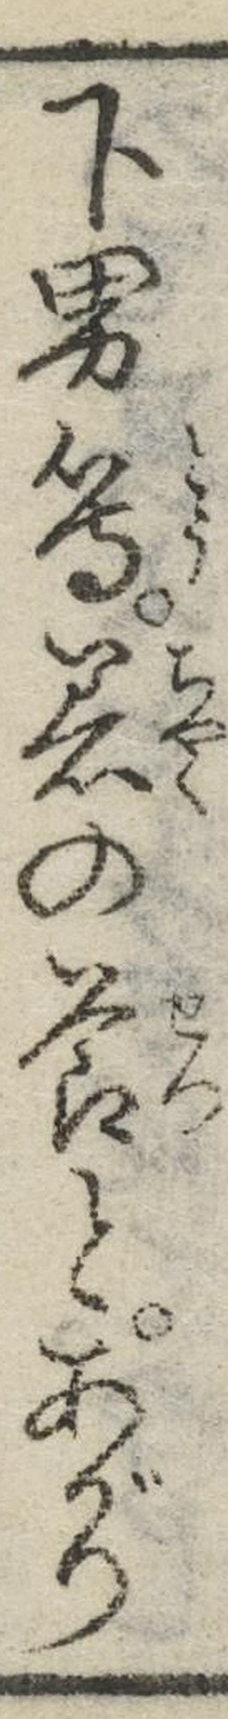下男等。着の節と。あがり
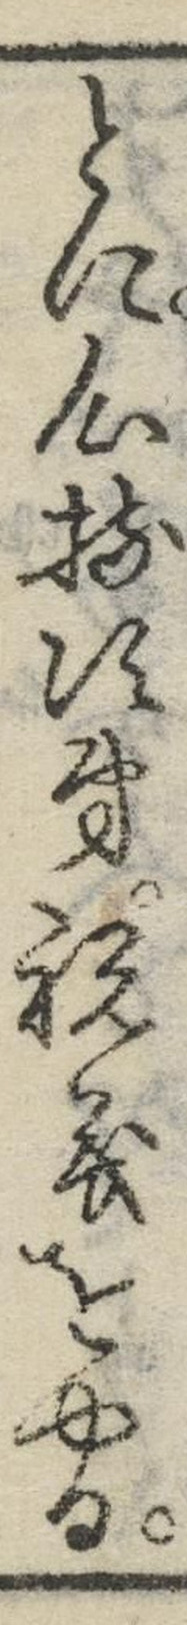とき。心持次第。祝義をやる。
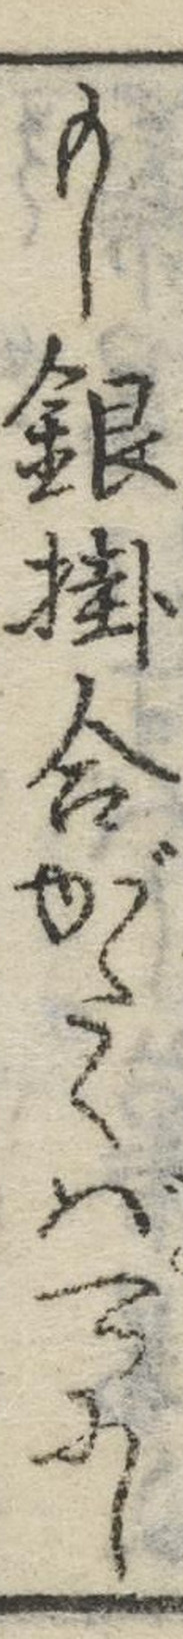もし銀掛合がたくば。一つにし
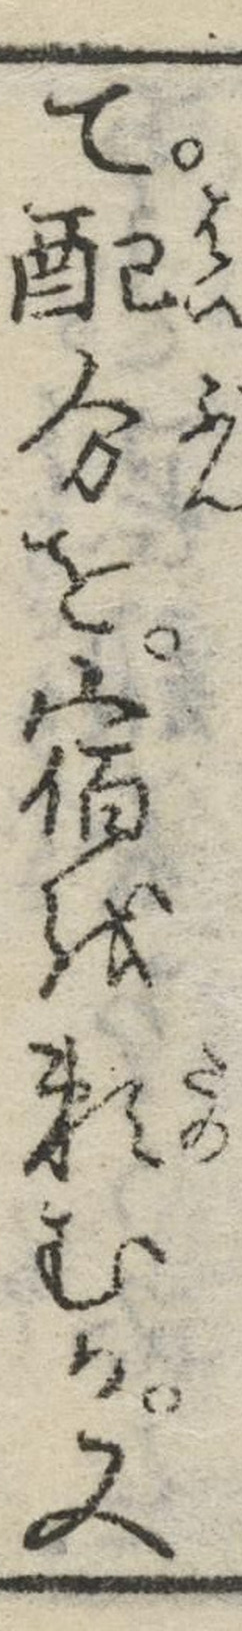て。配分を。宿を頼むか。又
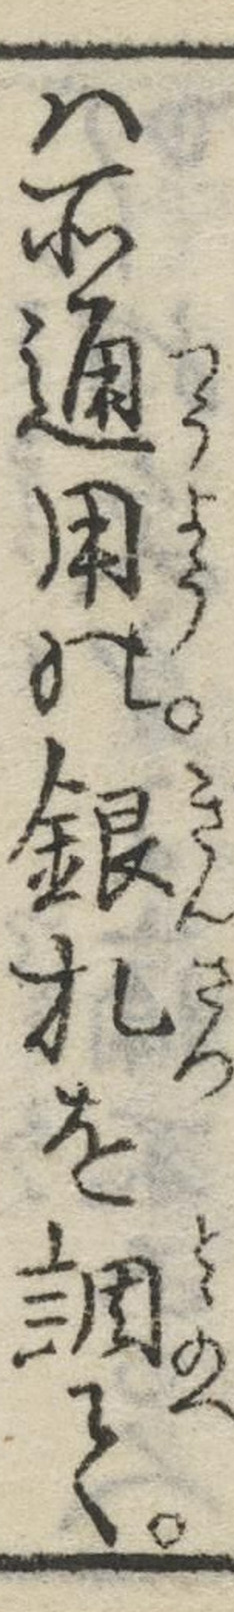は所通用の銀札を調て。
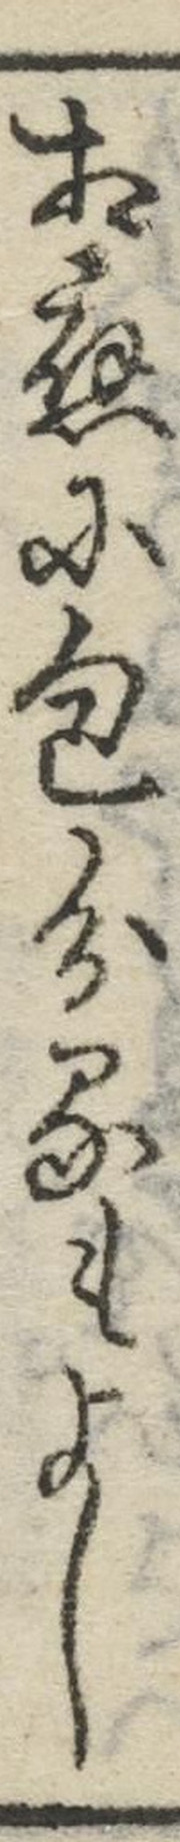相応に。包分るもよし
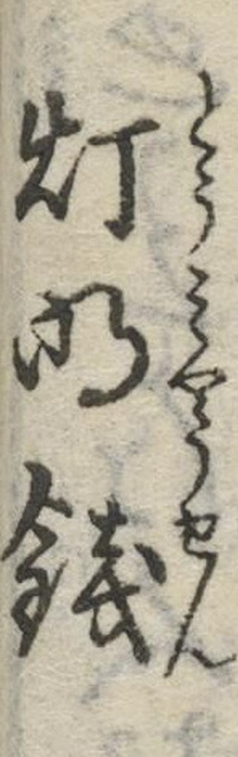灯明銭
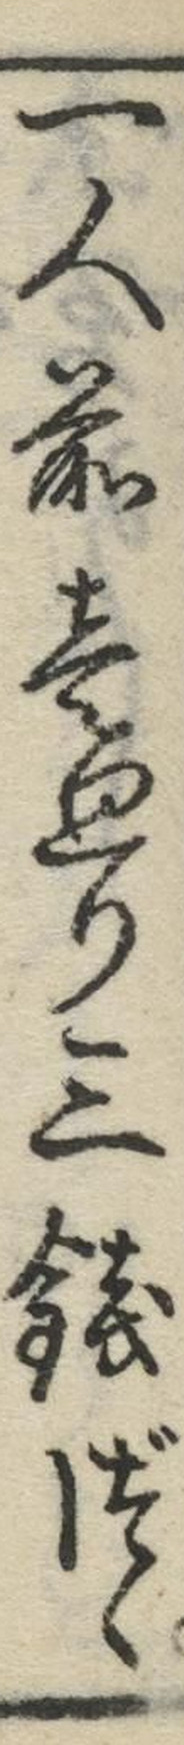一人前壱廻り三銭づゝ。
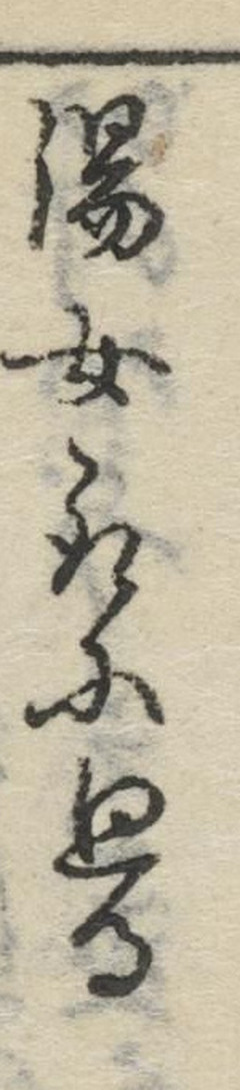湯女取りに廻る
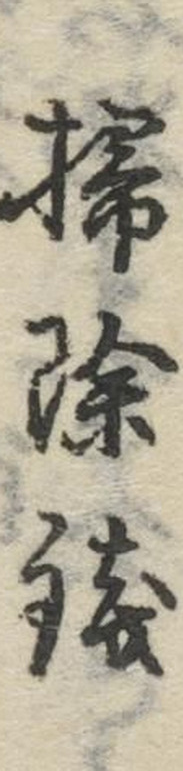掃除銭
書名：但州城崎浴湯辧
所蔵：東京大学地震研究所図書室 Earthquake Research Institute Library, The University of Tokyo, JAPAN
